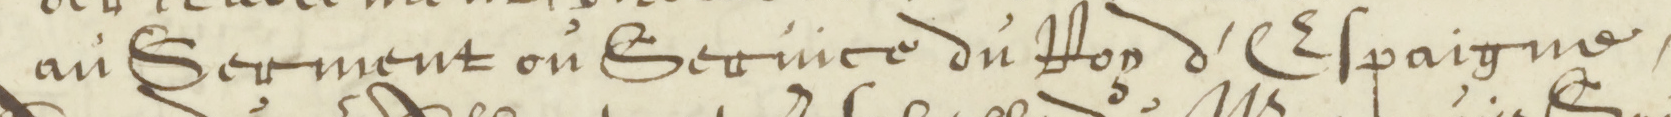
au Serment ou Seruice du Roy d'Espaigne,
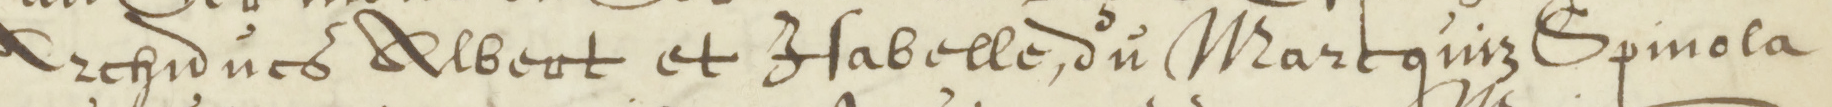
Archiducs Albert et Isabelle, du Marcquiz Spinola
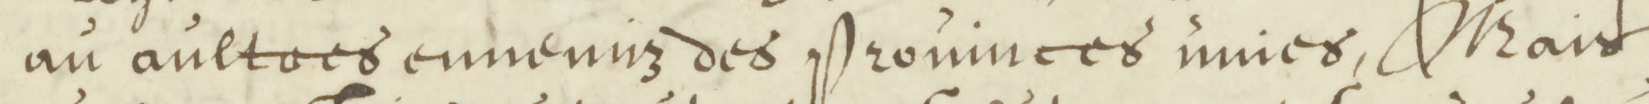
au aultres ennemiz des Prouinces unies. Mais
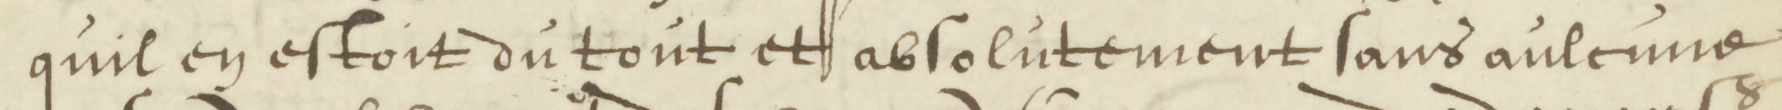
quil en estoit du tout et absolutement sans aulcune
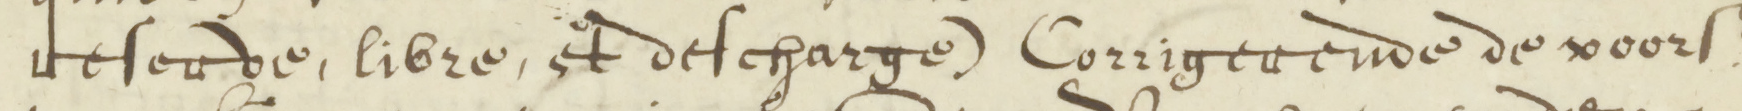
reserve, libre et descharge) Corrigerende de voors.
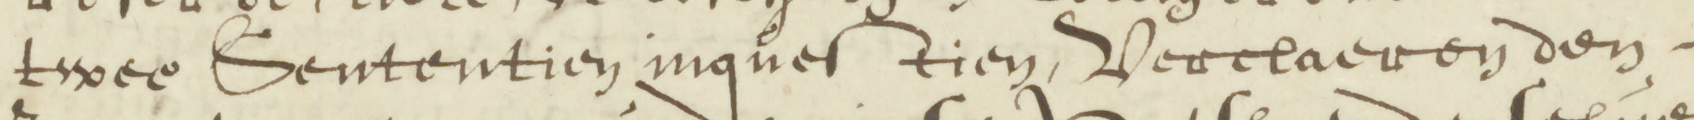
twee Sententien inquestien, Verclaeren den
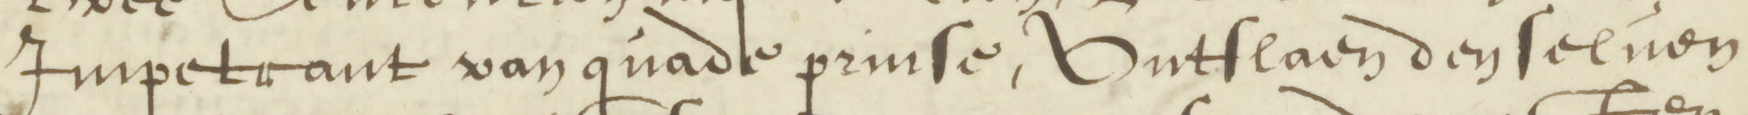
Impetrant van quade prinse, Ontslaen den seluen
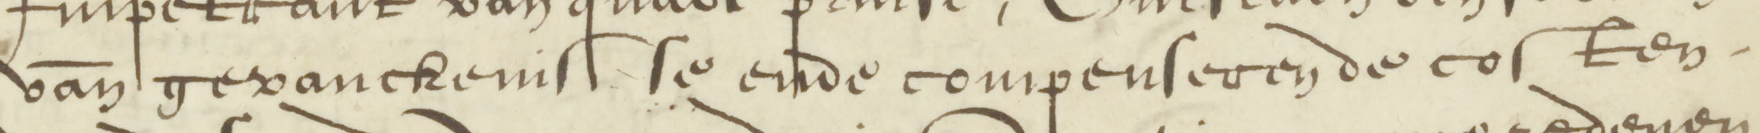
van gevanckenisse ende compenseren de costen,
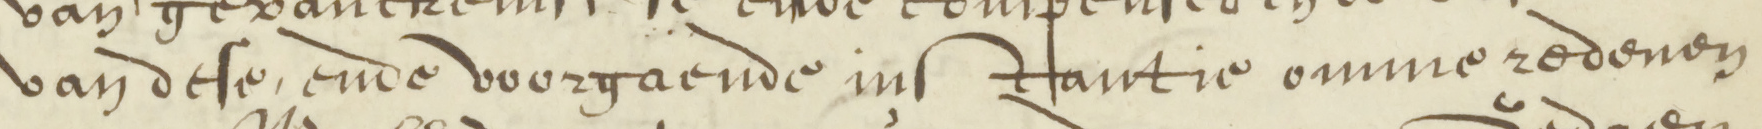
van dese, ende voorgaende instantie omme redenen
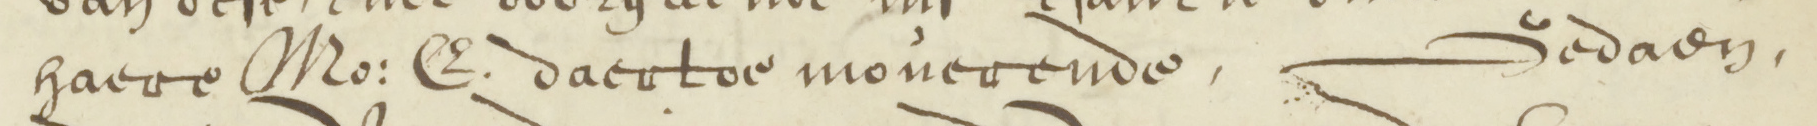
haere Mo: E. daertoe mouerende. Gedaen
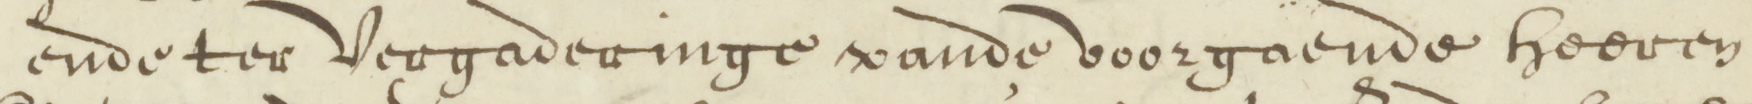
ende ter Vergaderinge vande voorgaende heeren
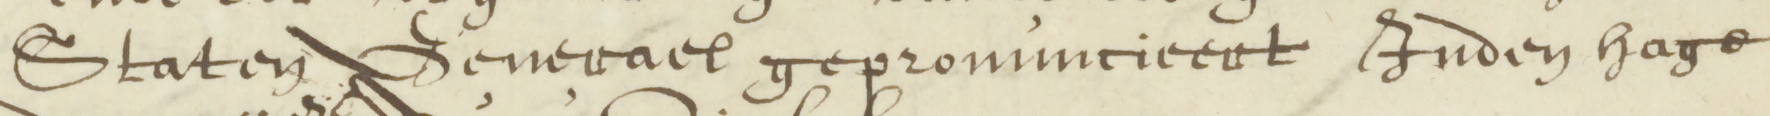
Staten Generael gepronuncieert Inden Hage
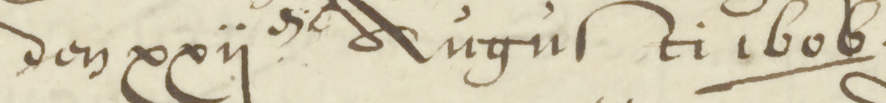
den xxije Augusti 1606.
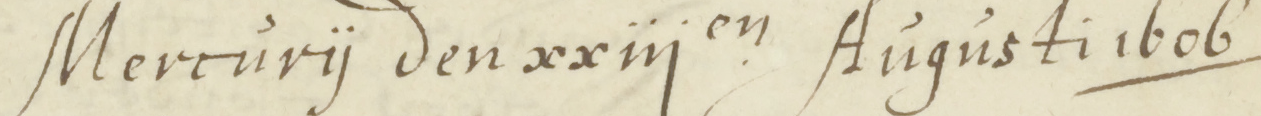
Mercurij den xxiijen Augusti 1606
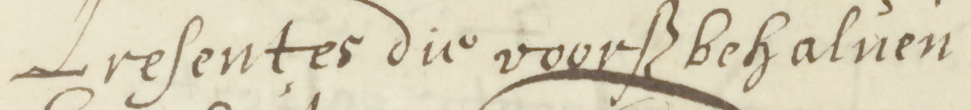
Presentes die voors behalven
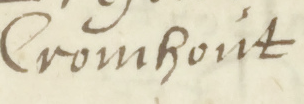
Cromhout
